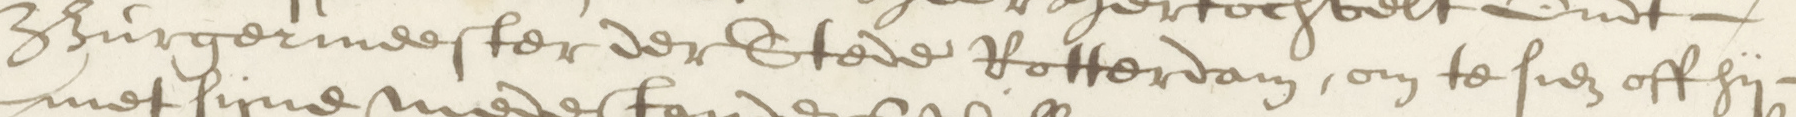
Burgermeester der Stede Rotterdam, om te sien off hij
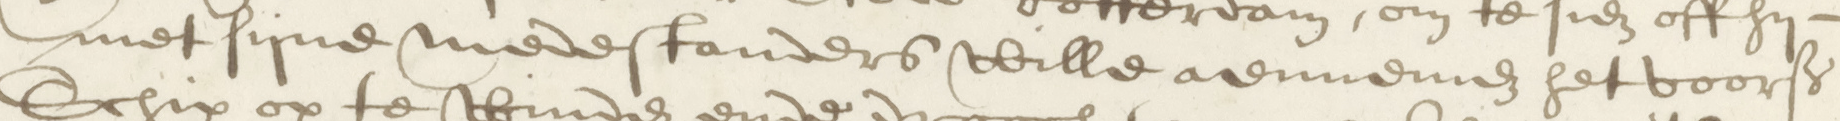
met sijne medestanders wille aennemen het voors
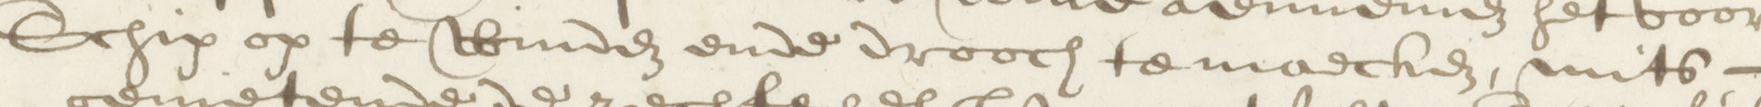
Schip op te winden ende drooch te maecken, mits -
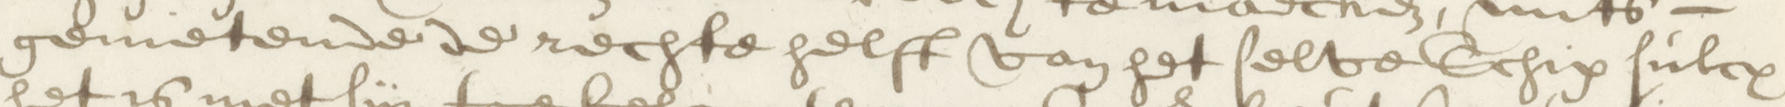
genietende de rechte helft van het selve Schip sulcx
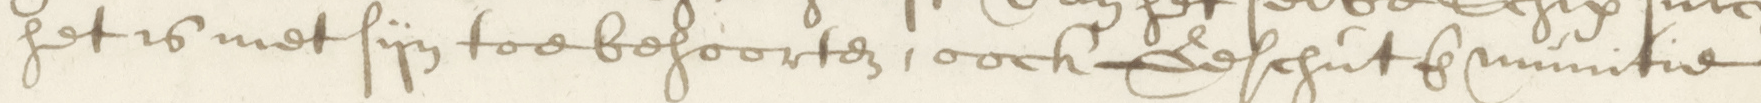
het is met sijn toebehoorten, oock Geschut & munitie
